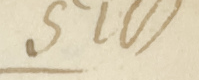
518
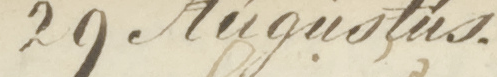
29. Augustus.
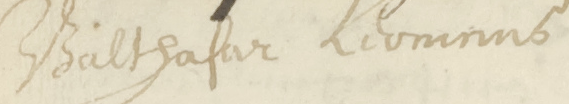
Balthasar Leoninus
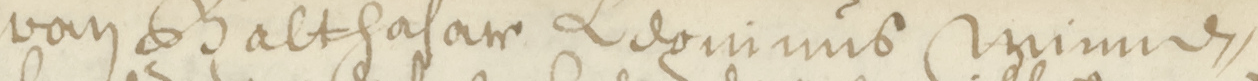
van Balthasar Leoninus Minne„
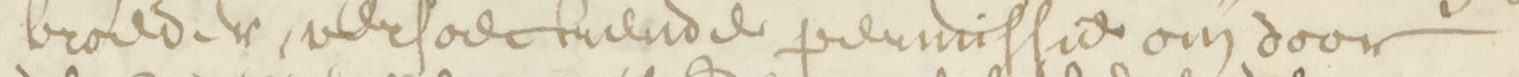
broeder, versoeckende permissie om door
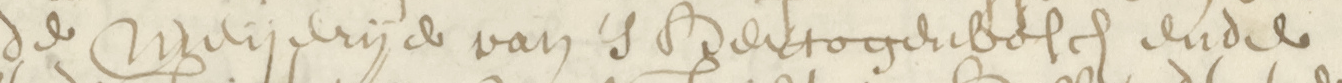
de Meijerije van ‛s Hertogenbosch ende
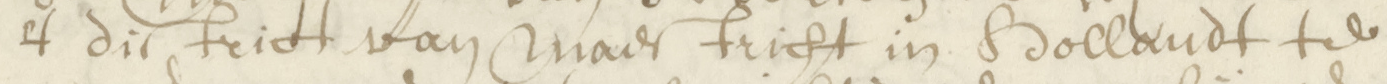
't district van Maestricht in Hollandt te
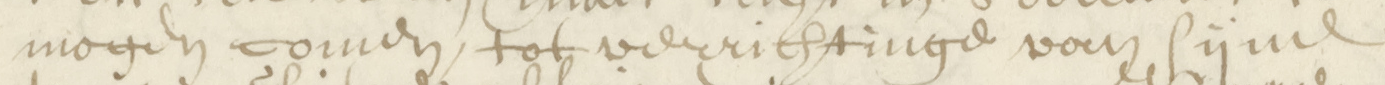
mogen comen, tot verrichtinge van sijne
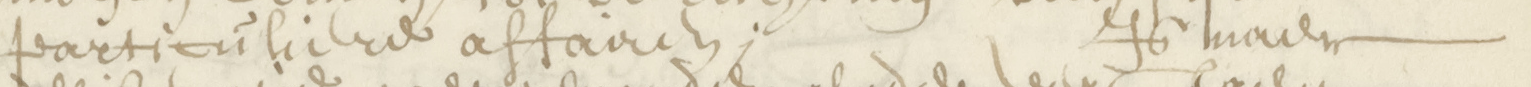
particuliere affairen: Is naer
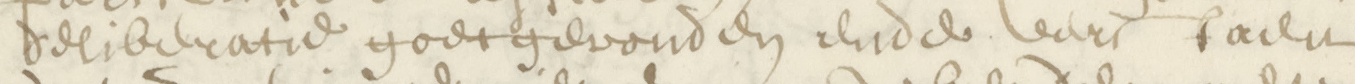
deliberatie goetgevonden ende verstaen
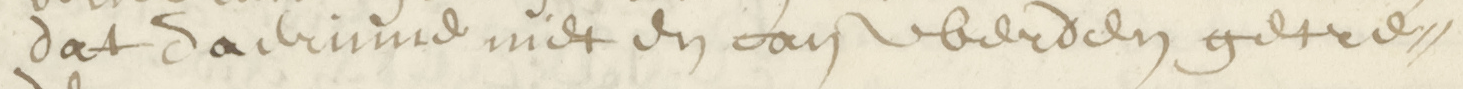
dat daerinne niet en can werden getre„
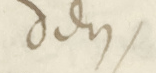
den.
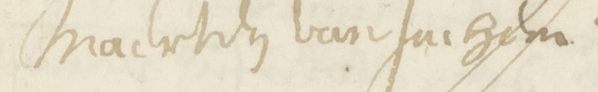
Maerten van Juchem.
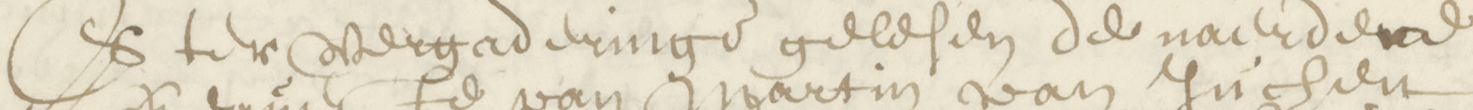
Is ter vergaderinge gelesen de naerdere
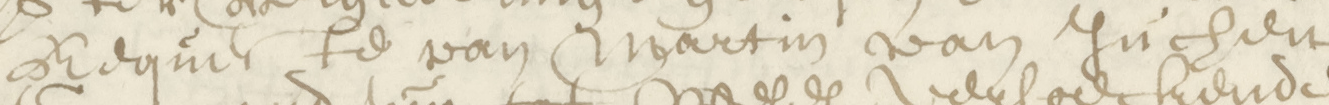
Requeste van Martin van Juchen
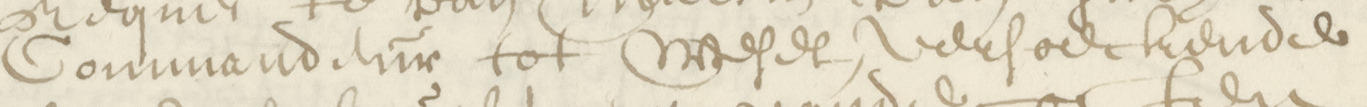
Commandeur tot Wesel, versoeckende
